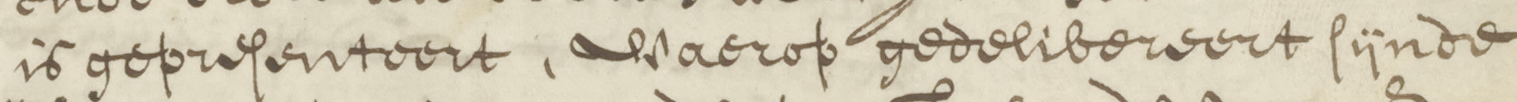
is gepresenteert. Waerop gedelibereert sijnde,
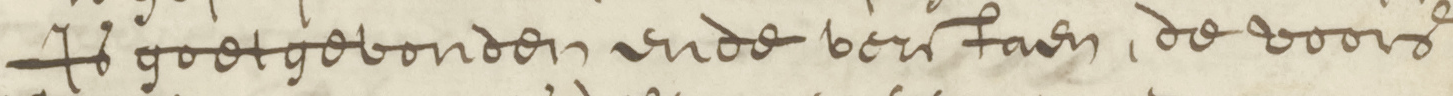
Is goetgevonden ende verstaen, de voors
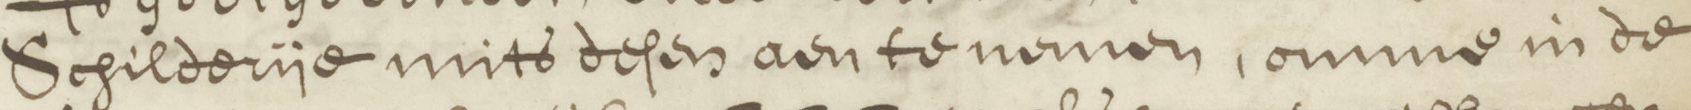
Schilderije mits desen aen te nemen, omme in de
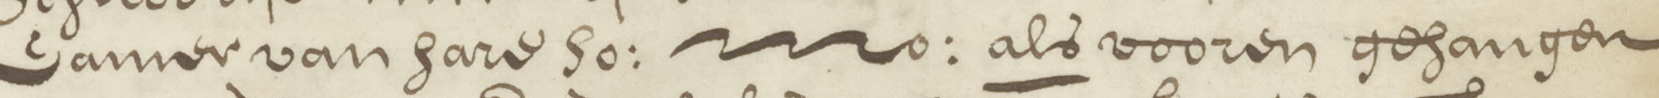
Camer van hare ho:Mo: als vooren gehangen
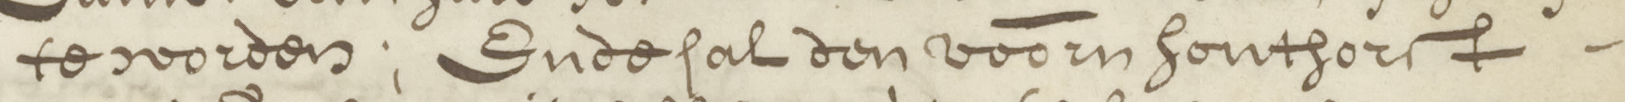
te worden; Ende sal den voorn honthorst -
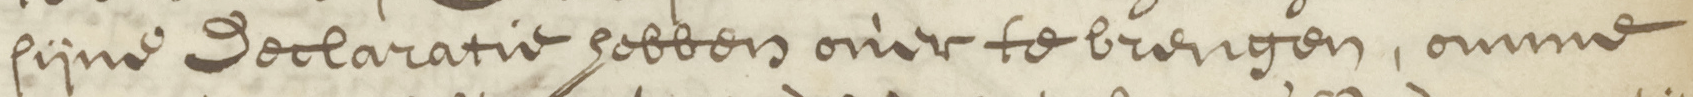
sijne Declaratie hebben ouer te brengen, omme
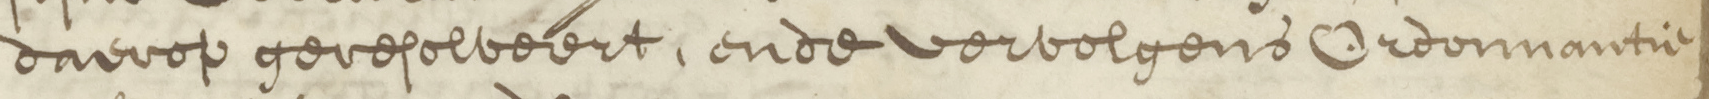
daerop geresolveert, ende vervolgens Ordonnantie
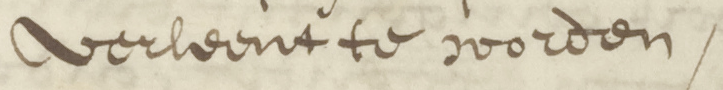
verleent te worden.
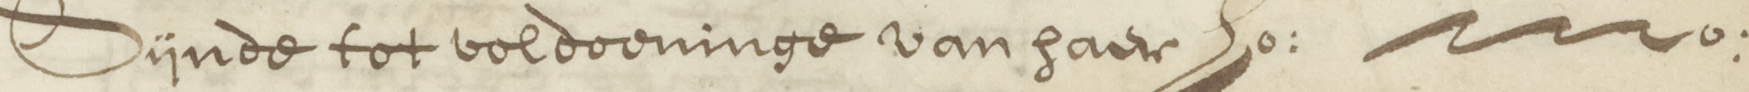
Sijnde tot voldoeninge van haer ho:Mo:
